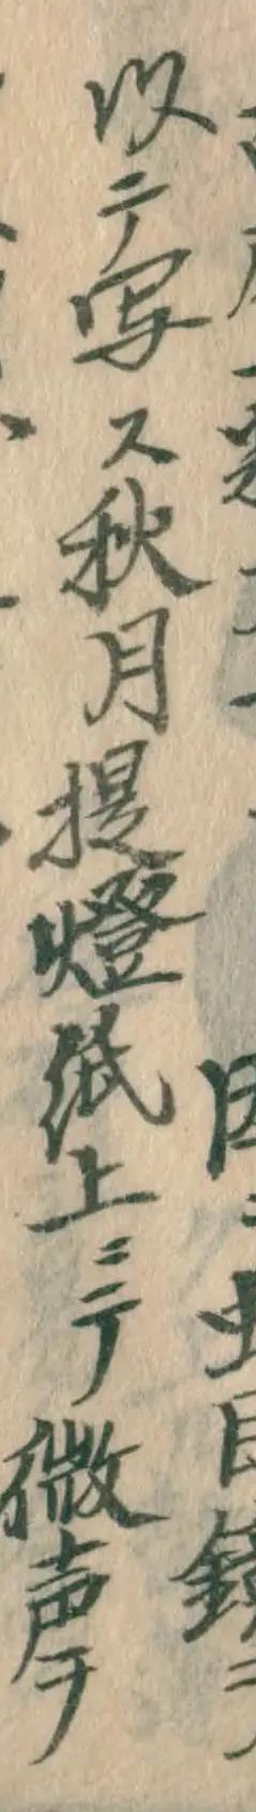以テ写ス秋月提燈紙上ニテ微声ヲ
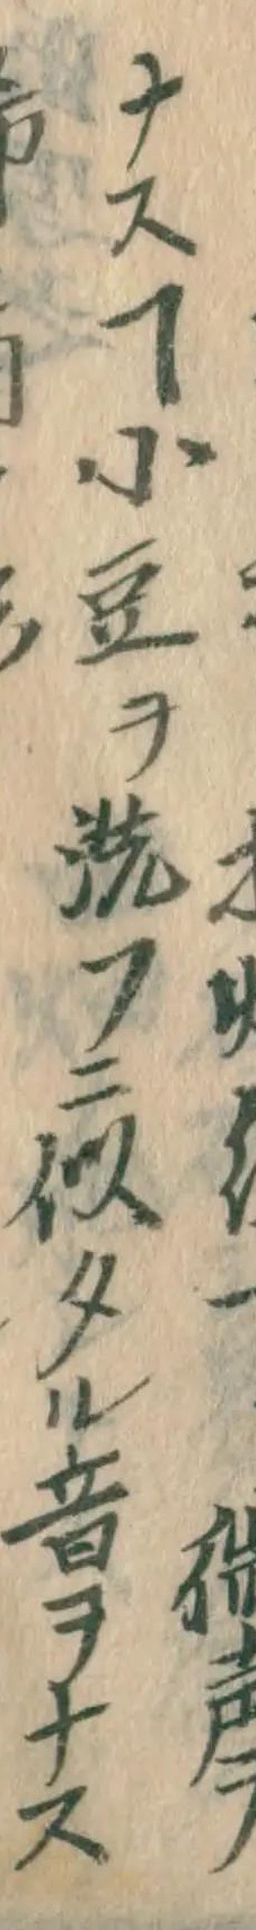ナスコト小豆ヲ洗フニ似タル音ヲナス
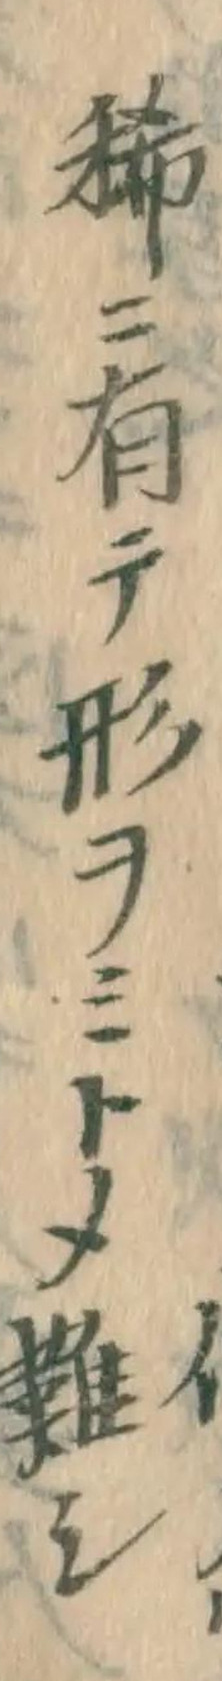稀ニ有テ形ヲミトメ難シ

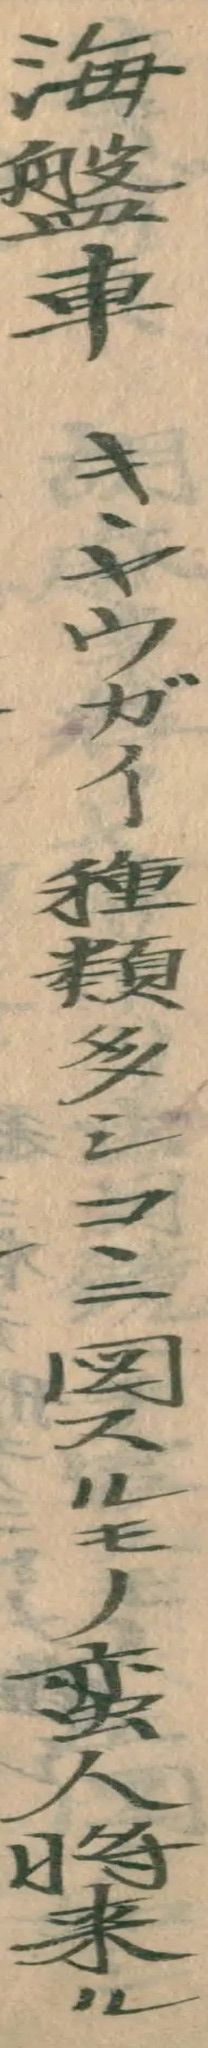海盤車キヽヤウガイ種類多シコヽニ図スルモノ蛮人将来ル
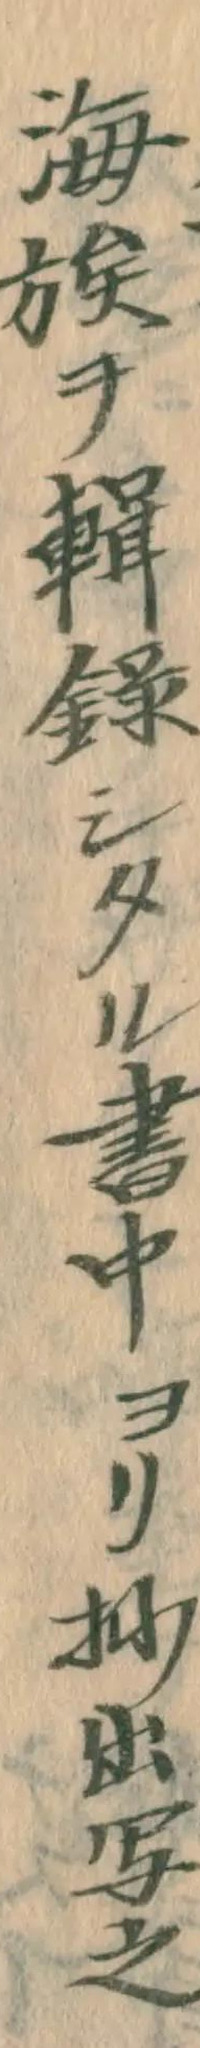海族ヲ輯録シタル書中ヨリ抄出写之
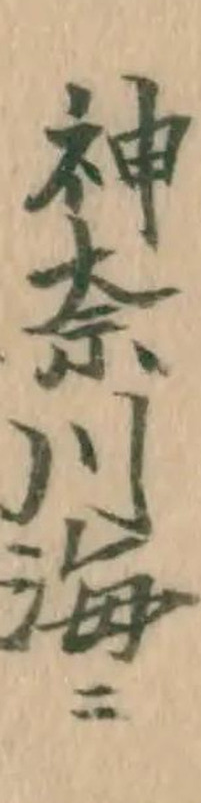神奈川海ニ
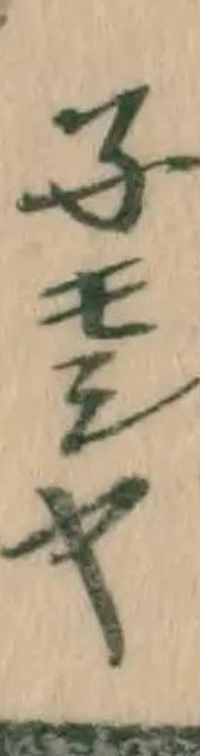子モシヤ
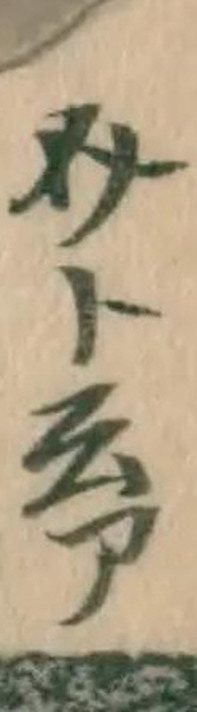介ト云ア
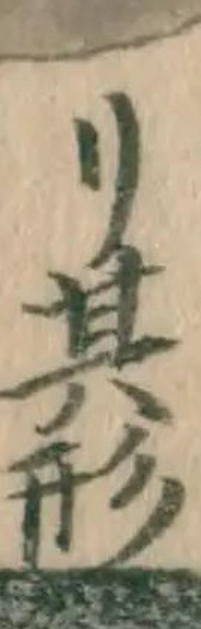リ其形
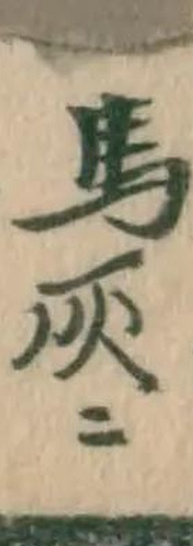馬灰ニ
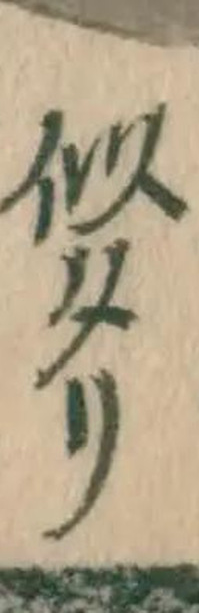似タリ
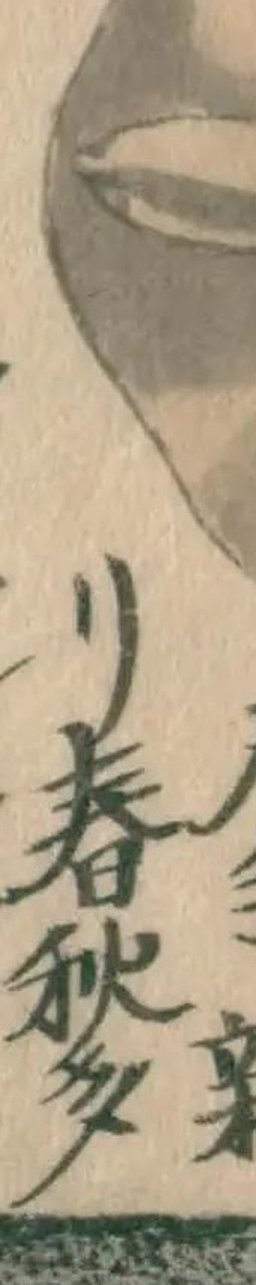リ春秋多
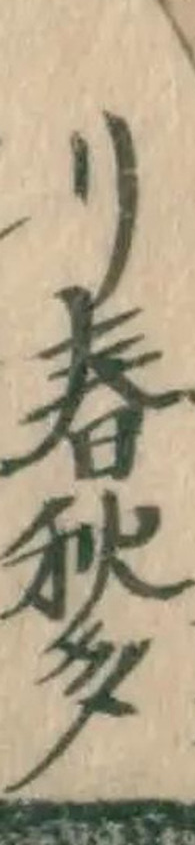リ春秋多
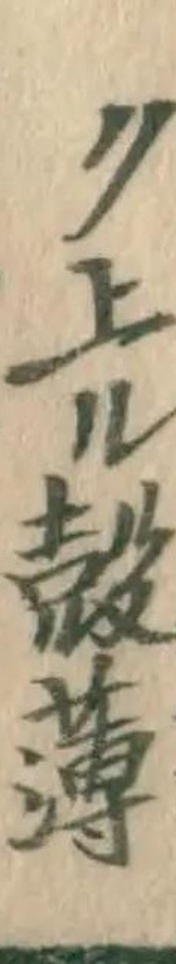ク上ル殻薄
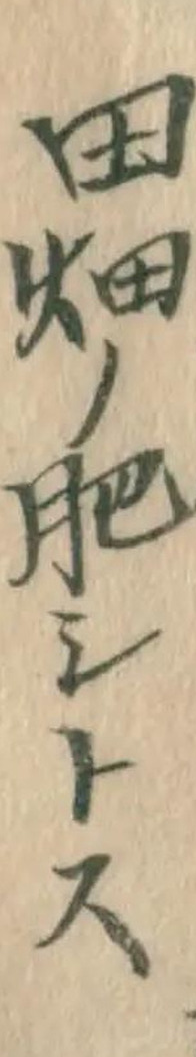田畑ノ肥シトス

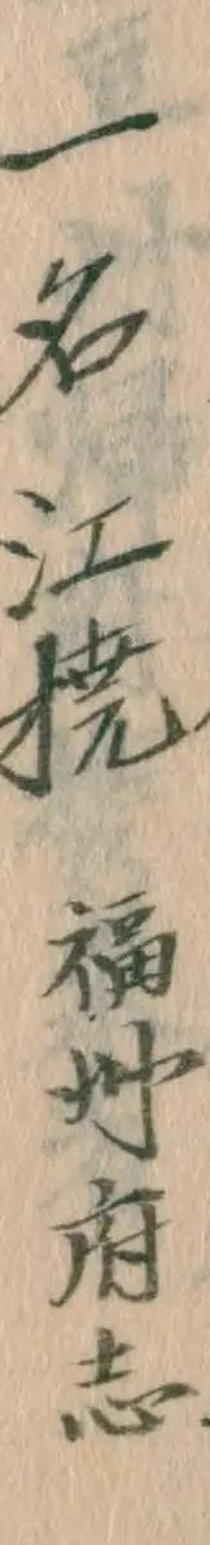一名江橈福州府志
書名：千蟲譜 3巻. [1]
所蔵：国立国会図書館 National Diet Library, JAPAN
